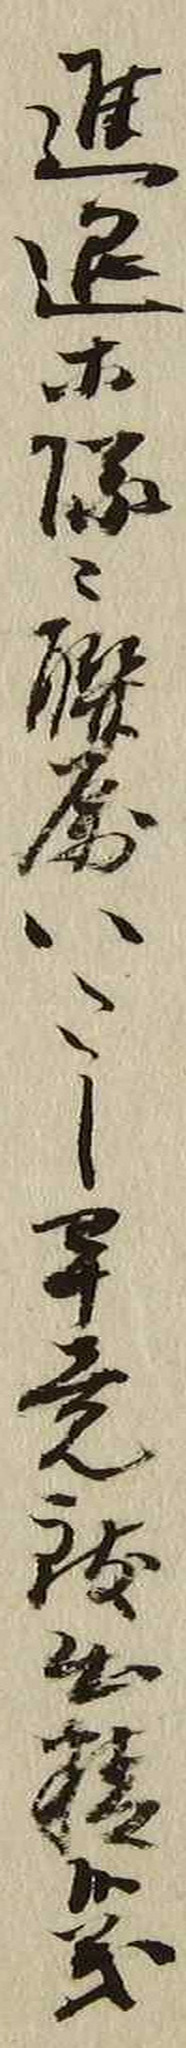進退等隊々聯属いたし畢竟致出精候義
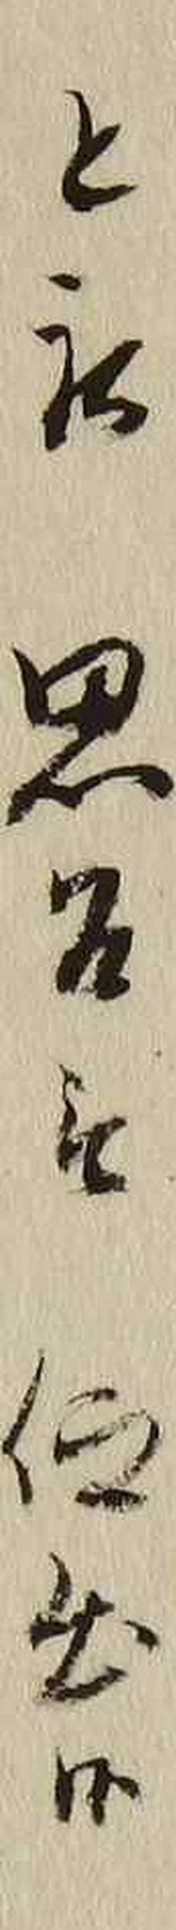と被思召被仰出候
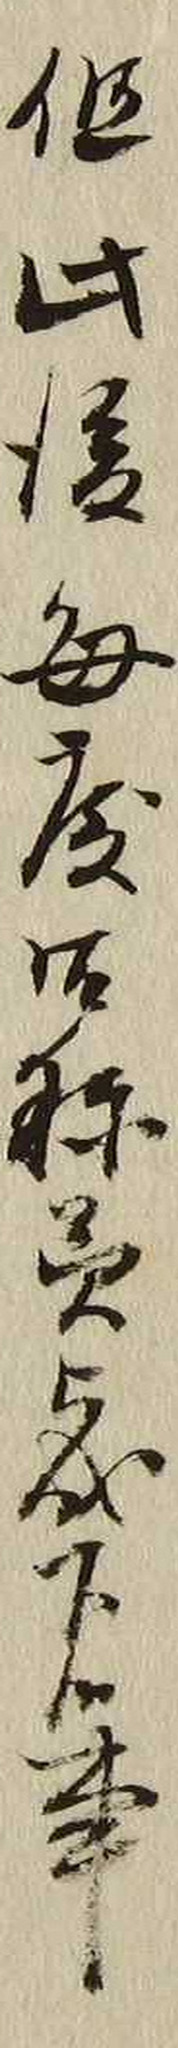但此後毎度御称美被成下候事
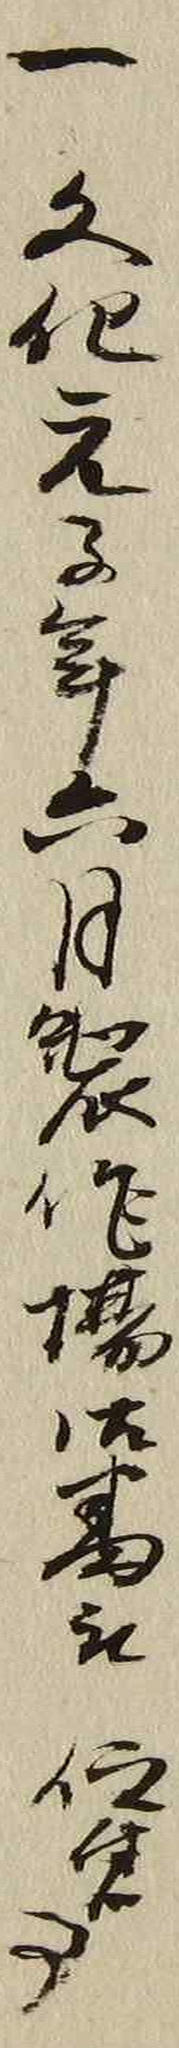一文化元子年六月製作場御番被仰付候事
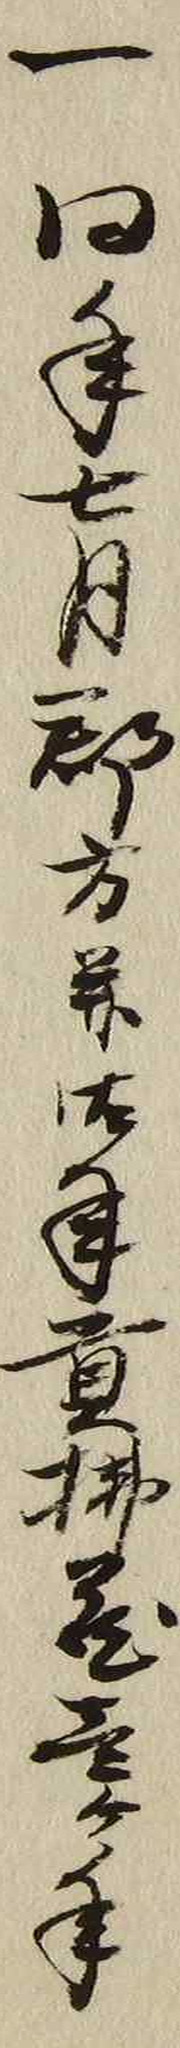一同年七月郡方并御年貢払蔵壱ケ年
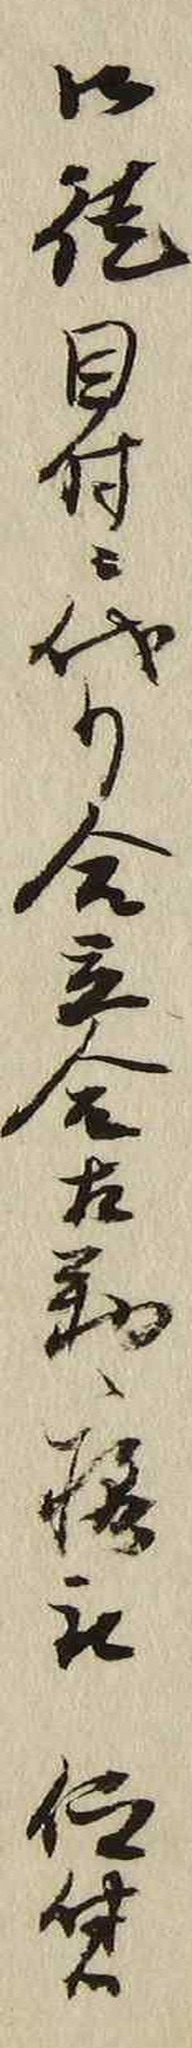御徒目付ニ代り合立合相勤候様被仰付候
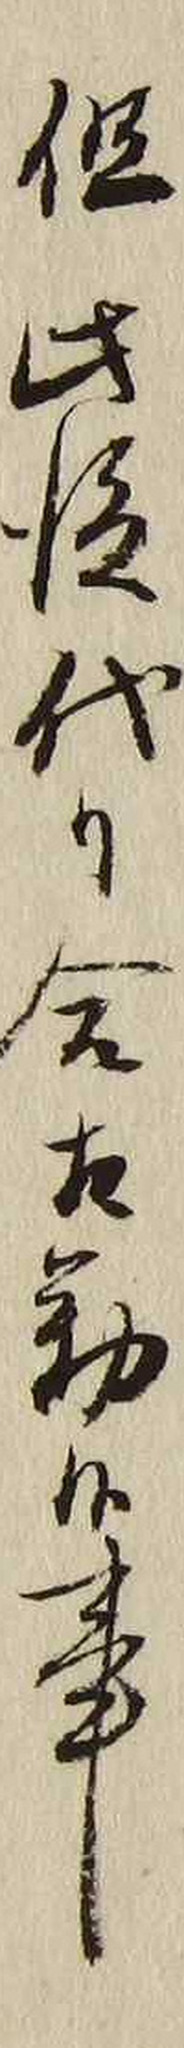但此後代り合立相勤候事
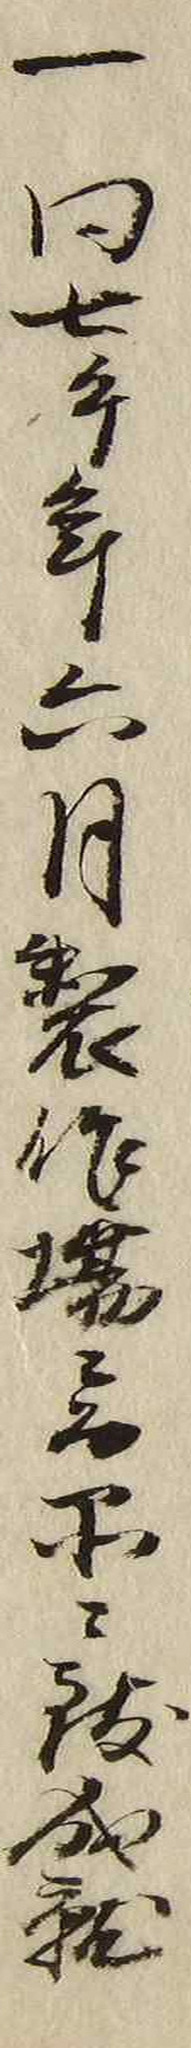一同七午年六月製作場ニ而品々致成就
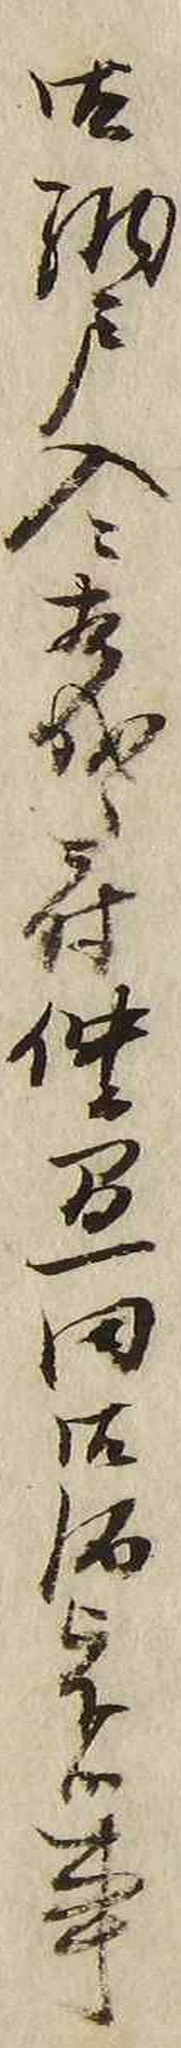御納戸入ニ相成候ニ付仲ケ間一同御酒被下候事

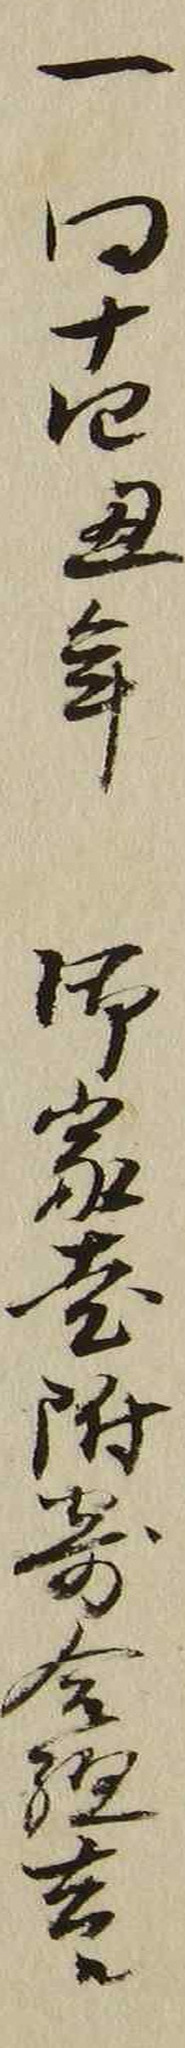一同十四丑年御家老附寄合組去ル
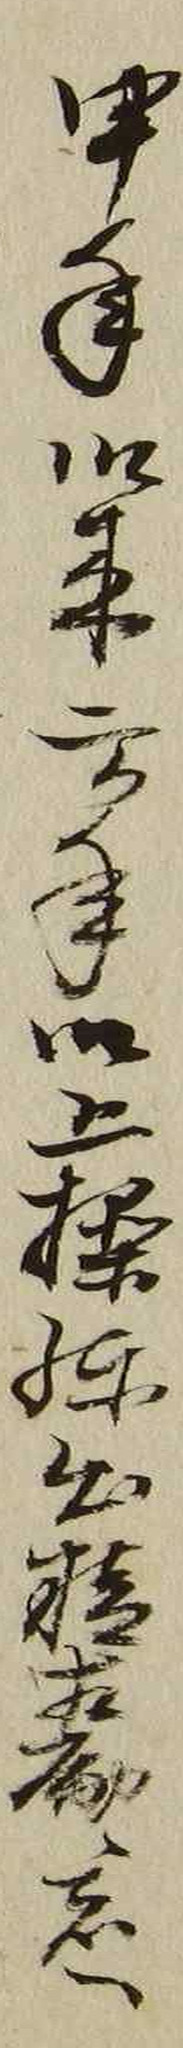申年以来二ケ年御上操練出精相励候者へ
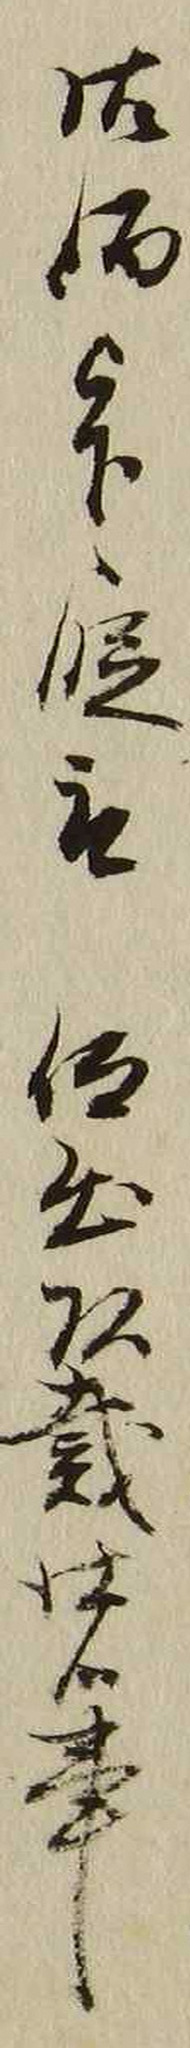御酒被下候段被仰出頂戴仕候事
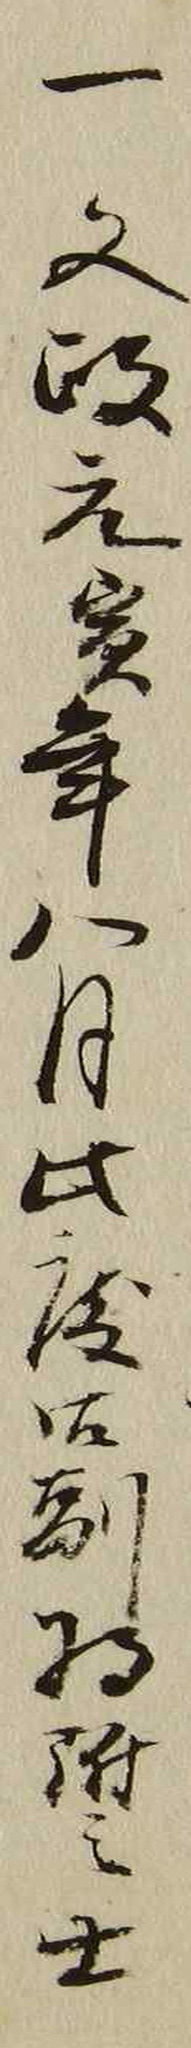一文政元寅年八月此度御副将附之士
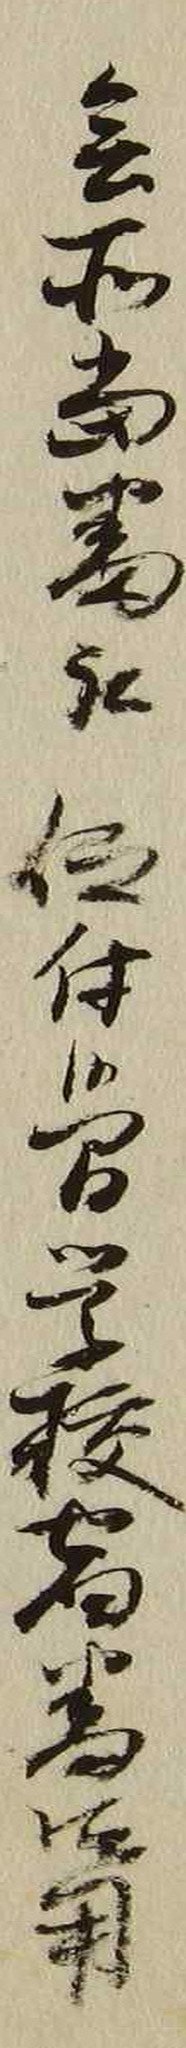会所当番被仰付候間学校宿番御用
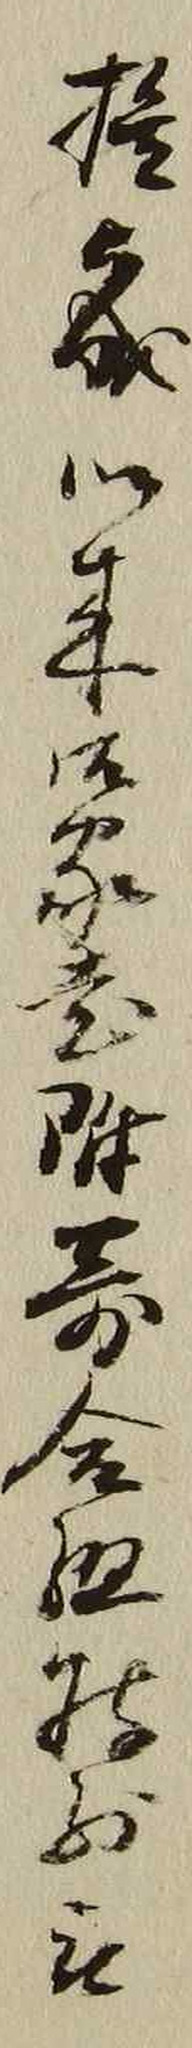捨被成以来御家老附寄合組特別被
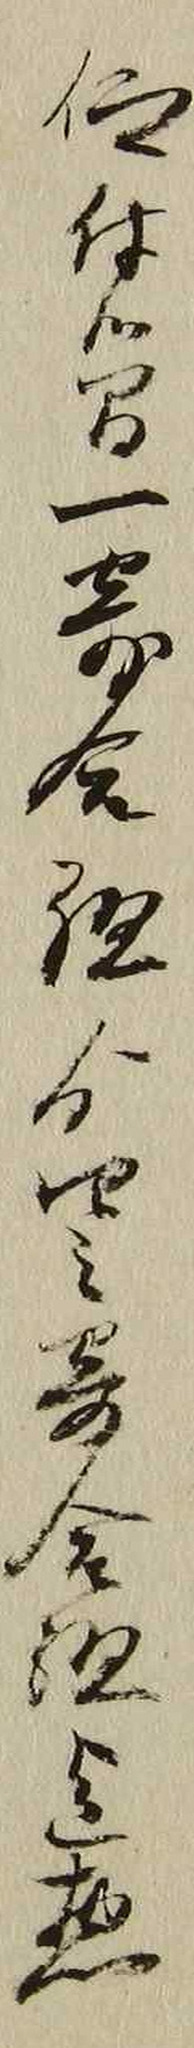仰付候間一寄合組ゟ四之寄合組迄惣
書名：諸士系譜　巻之349　も之部5
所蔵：会津若松市立会津図書館
